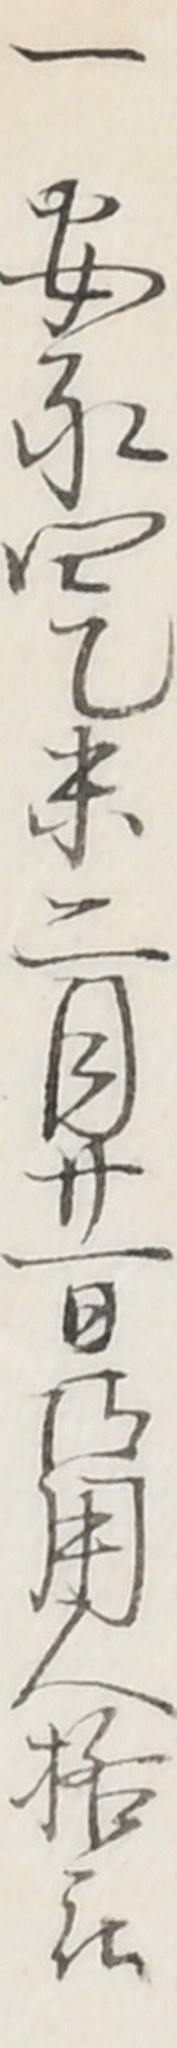一安永四乙未ニ月廿一日御用人格被
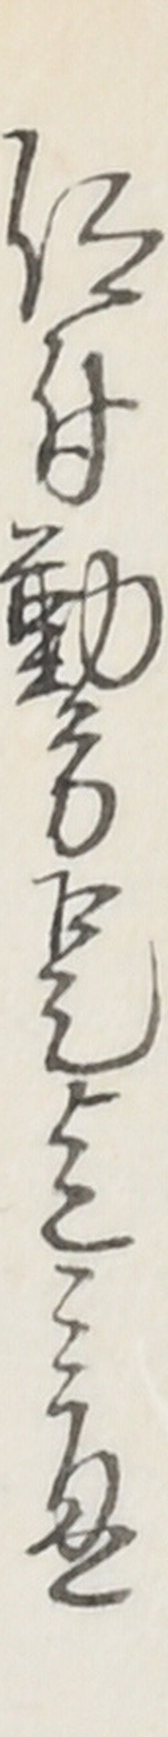仰付勤方是迄之通
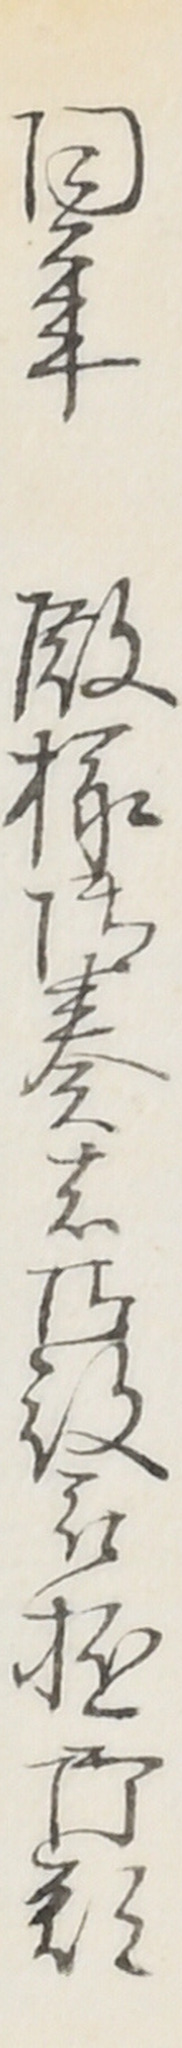一同年殿様御奏者御役被遊御願
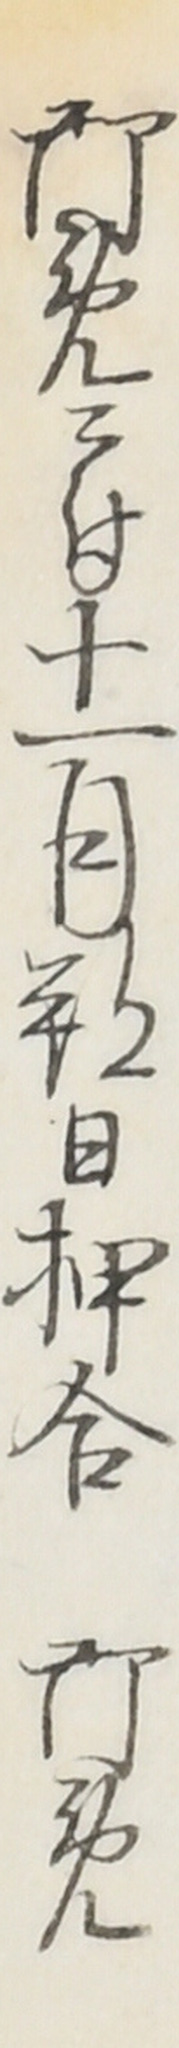御免ニ付十一月朔日押合御免
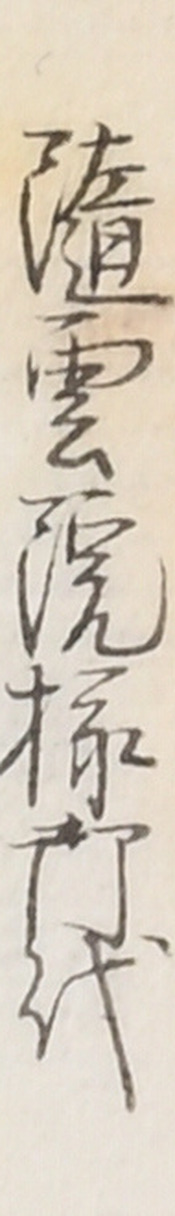隨雲院様御代
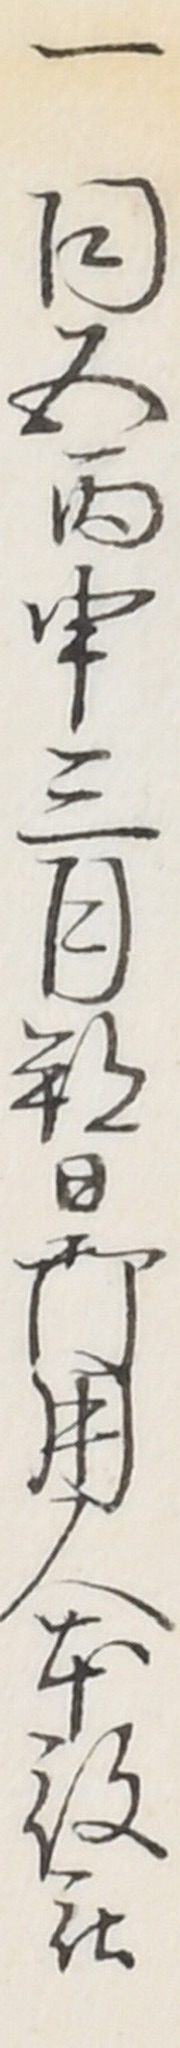一同五丙申三月朔日御用人本役被
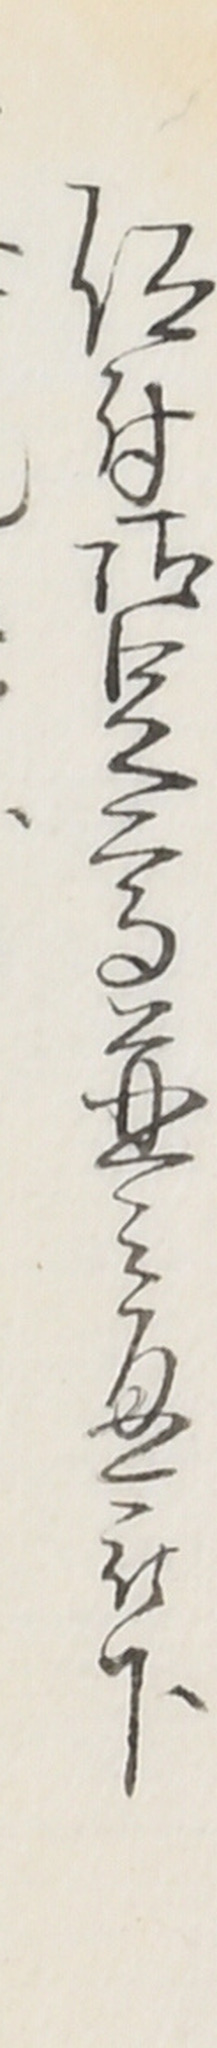仰付御足高並之通被下
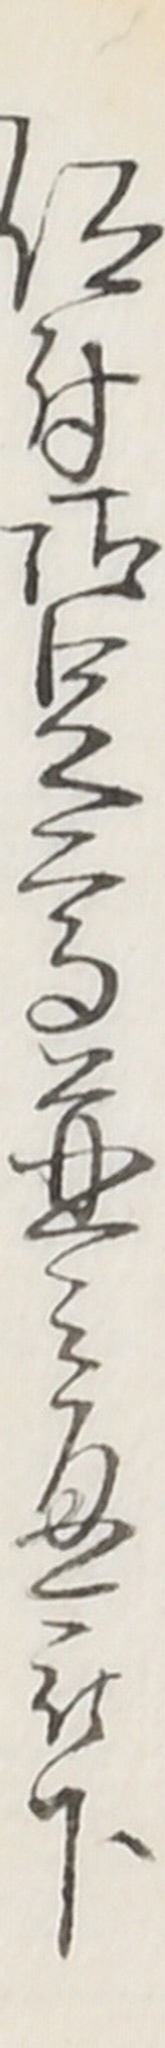仰付御足高並之通被下
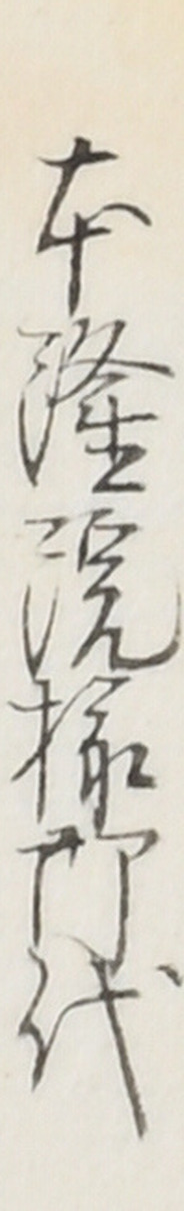本隆院様御代
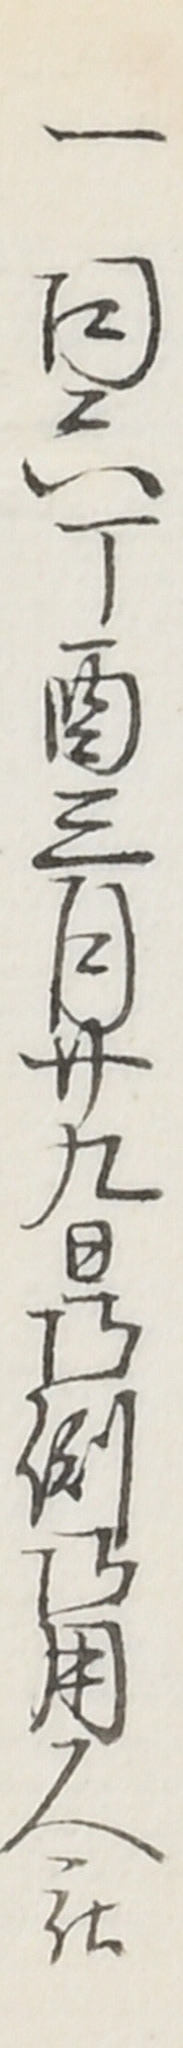一同六丁酉三月廿九日御側御用人被
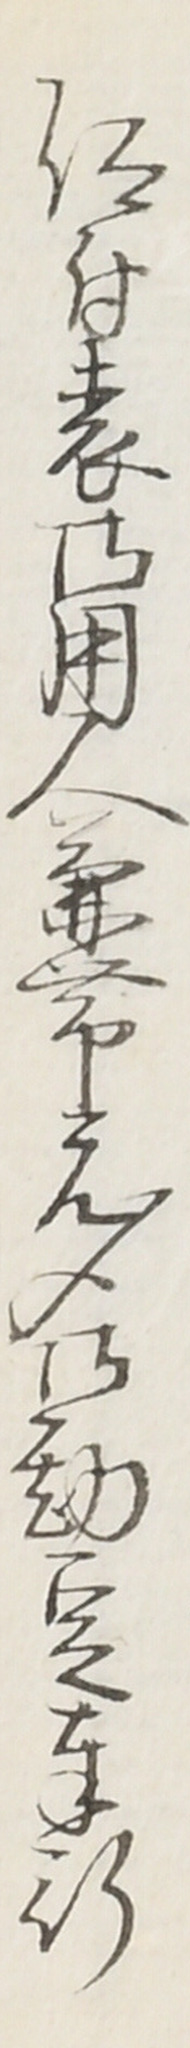仰付表御用人兼帯元〆御勘定奉行
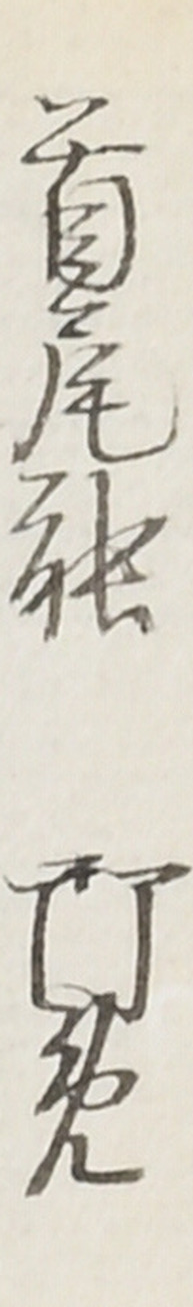首尾能御免
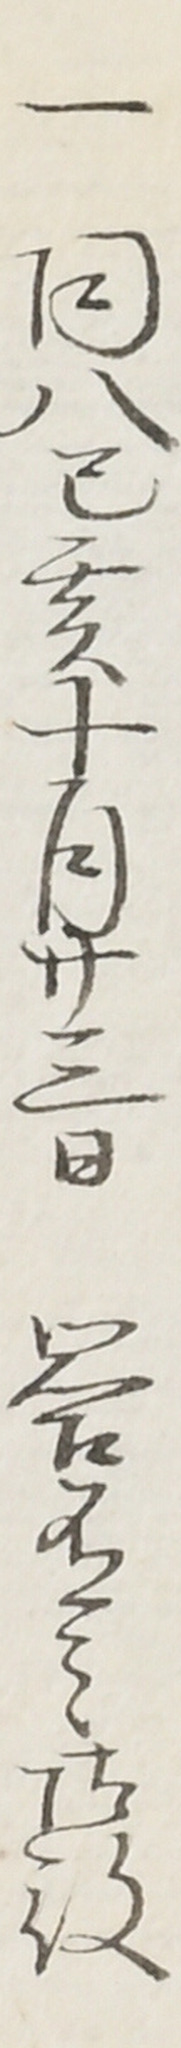一同八己亥十月廿三日思召有之御役
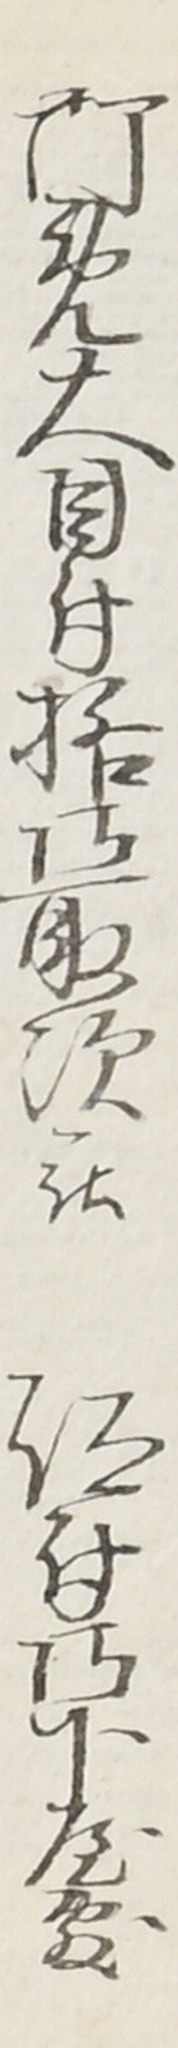御免大目付格御取次被仰付御下屋敷
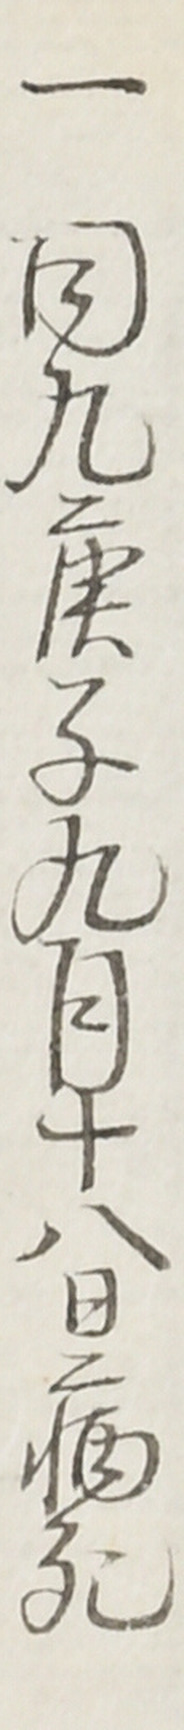一同九庚子九月十八日病死
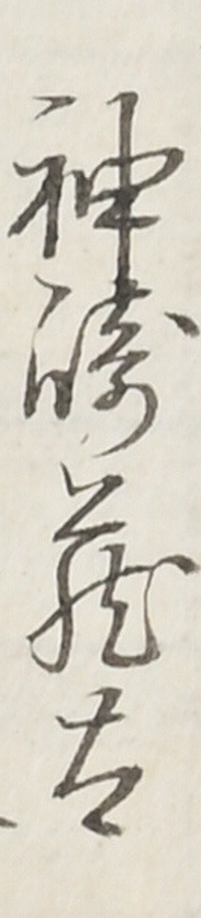神崎蔵太
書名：給人諸士勤仕録（七）
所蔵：伊那市立高遠町図書館・合同会社AMANE
